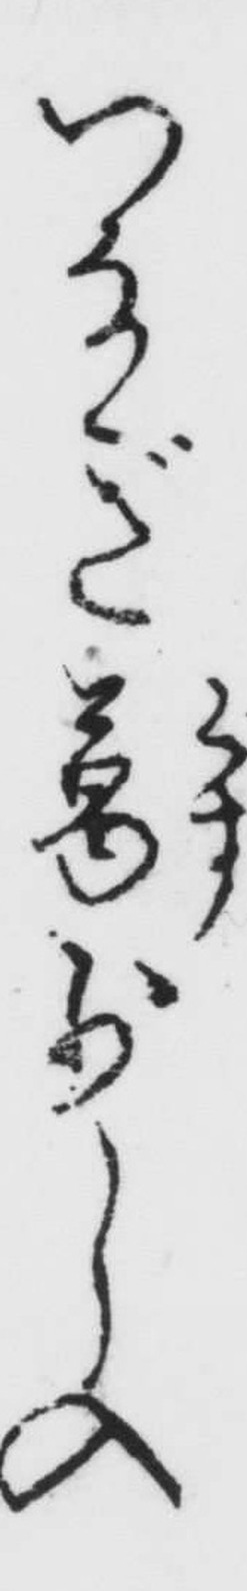つなぎ葛少し入
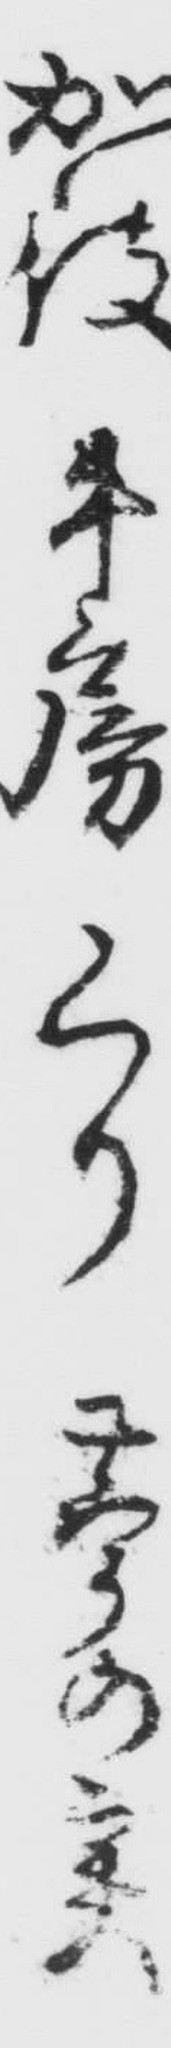加役午房くり苧の実
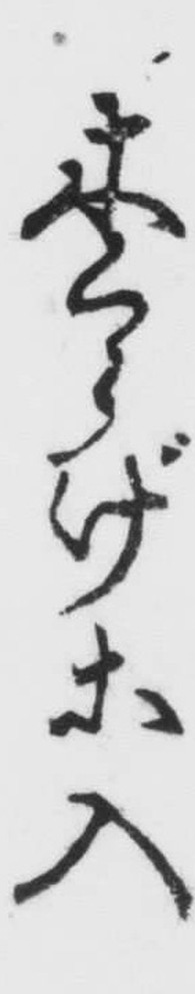木くらげ等入
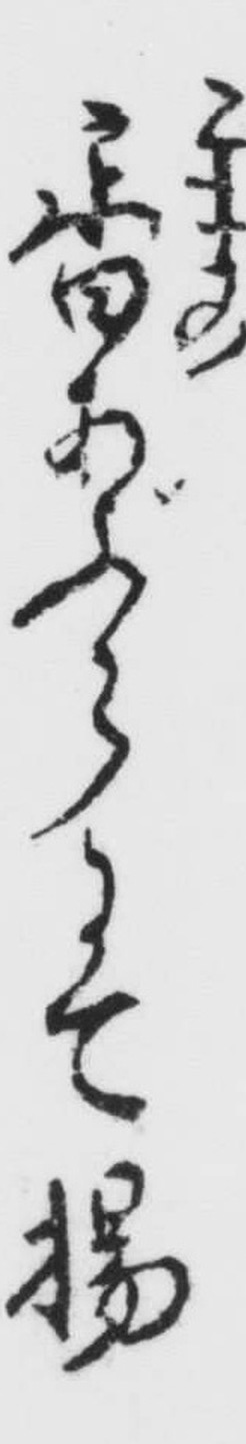香あぶらにて揚
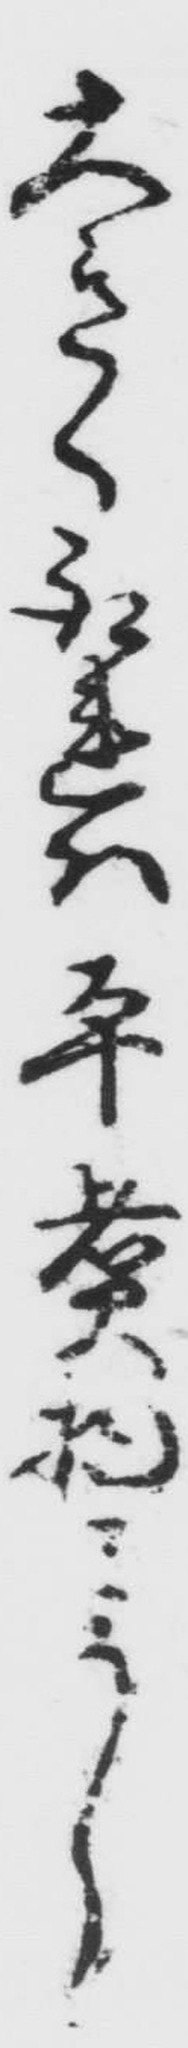大きく取れは平煮物によし
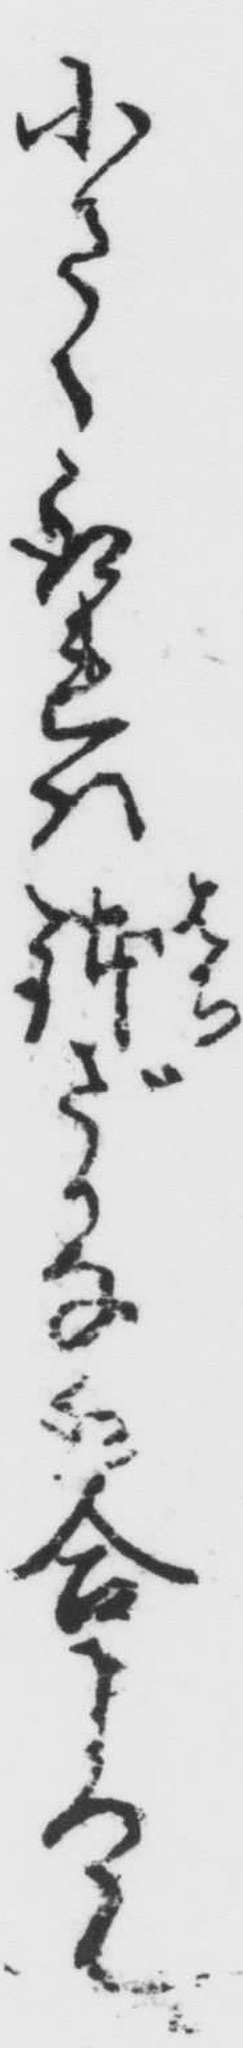小さく取れは鉢ざかな取合よろし
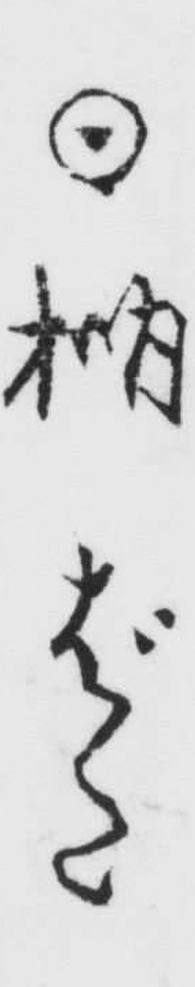⦿棚ばた

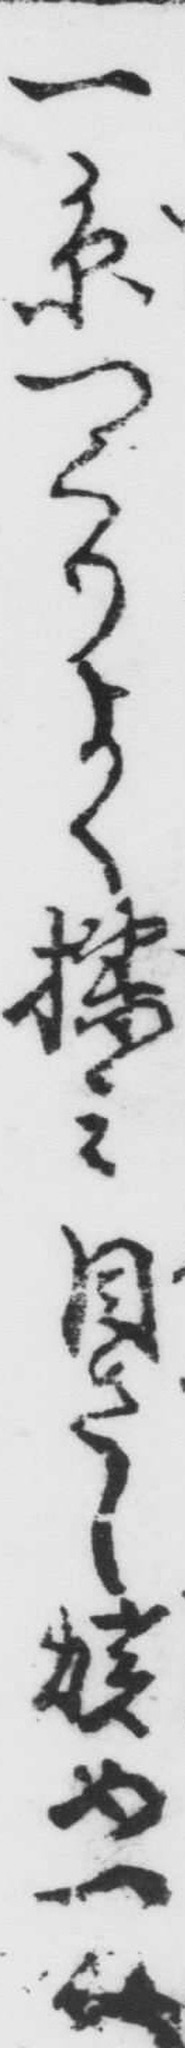一糸つくりよく揉み目ざし焼めつけ
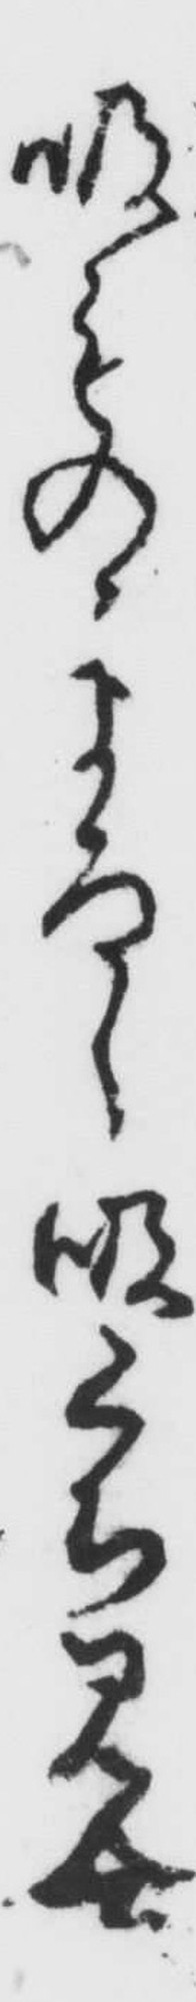吸ものによろし吸くち見合
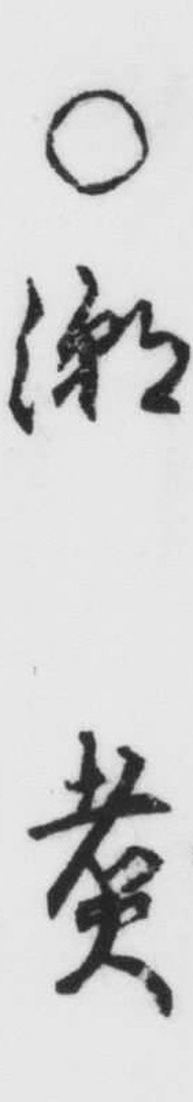○潮煮
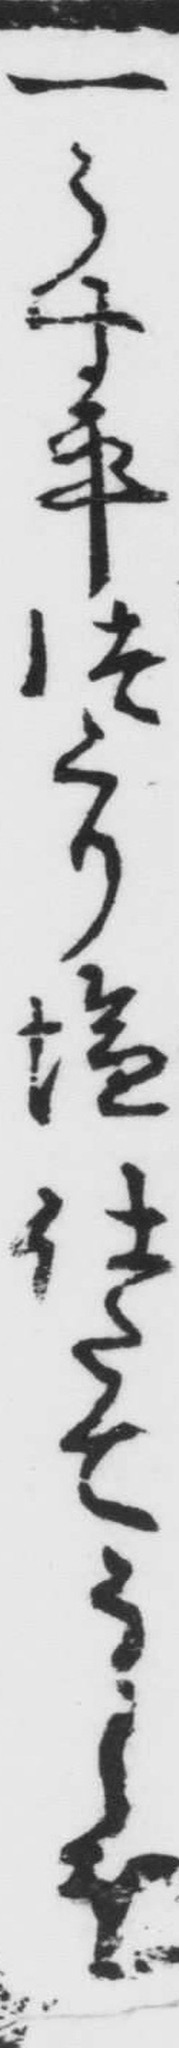一うす平づくり塩仕たてうしを
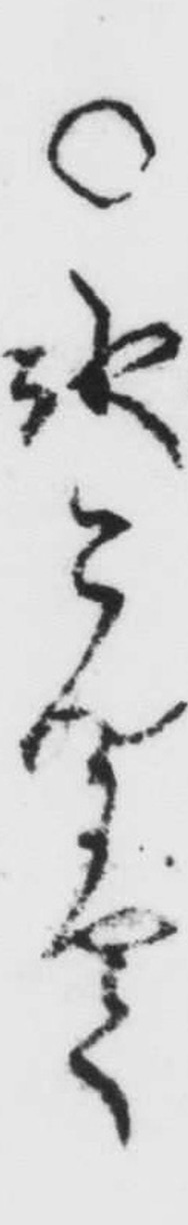○氷こんにやく
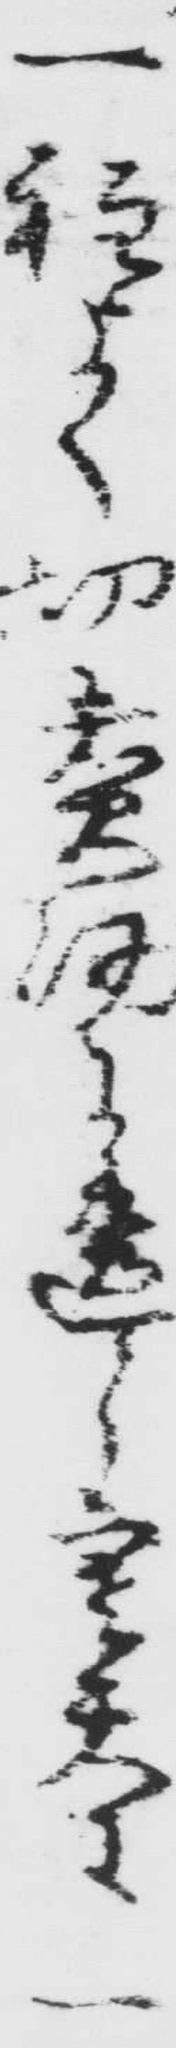一程よく切煮湯に透し寒天に一
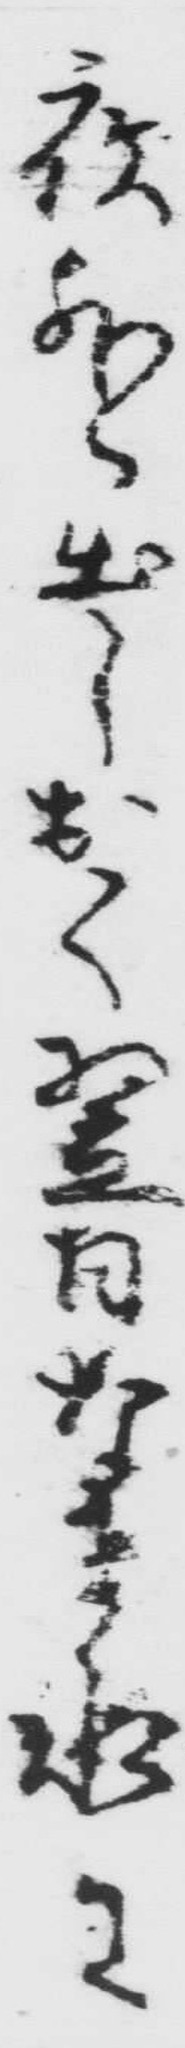夜外へ出しおく翌日なま氷に
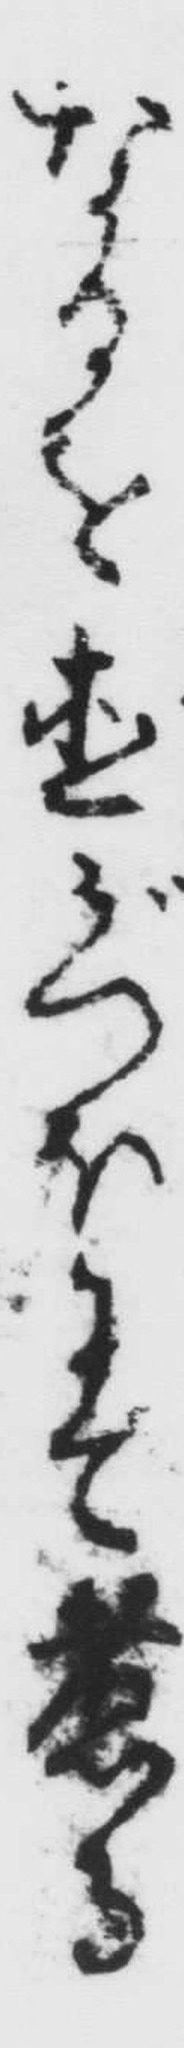なるを直がつほにて煮る
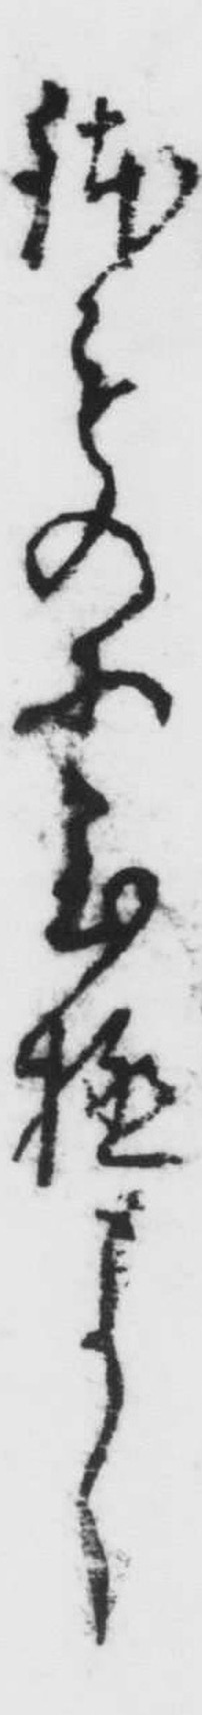鉢ものに至極よし
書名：蒟蒻百珍
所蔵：大阪府立大学学術情報センター 国文学研究資料館
